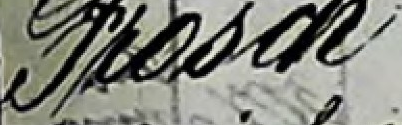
Frosch
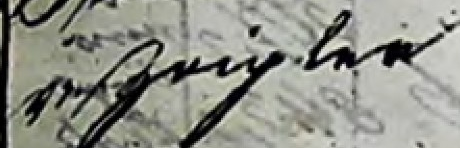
v. Zeigler
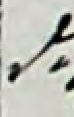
Do
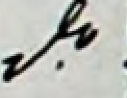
Do
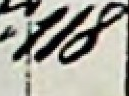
118
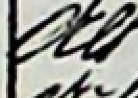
Alt
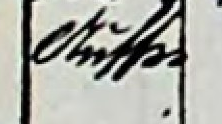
Aussee
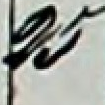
25
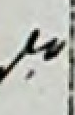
Do
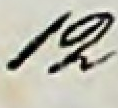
12
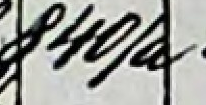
840/a
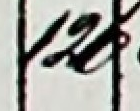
126
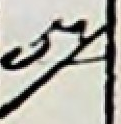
57
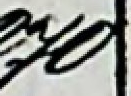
270
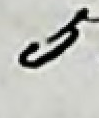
5
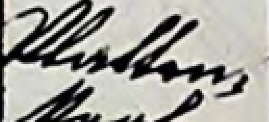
Platten„
